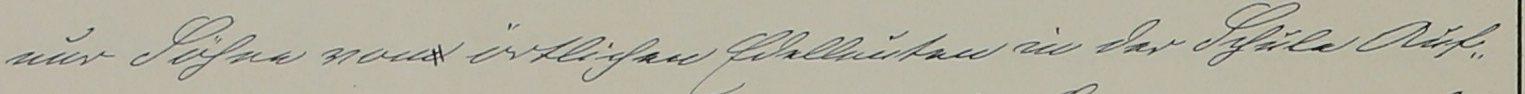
nur Söhne von örtlichen Edelleuten in der Schule Auf-
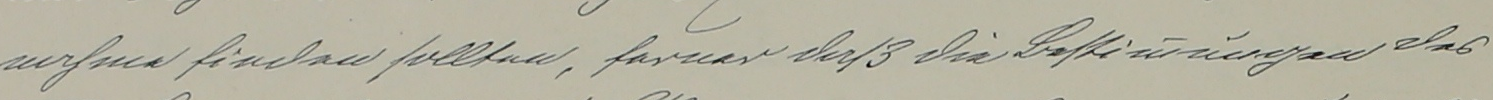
nahme finden sollten, ferner daß die Bestimmungen des
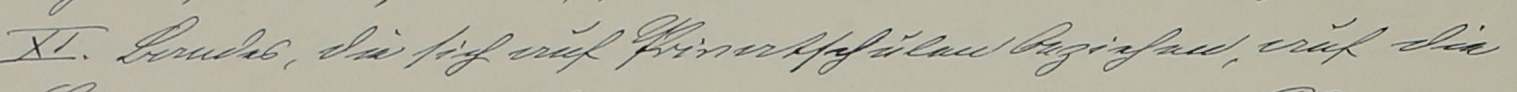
XI. Bandes, die sich auf Privatschulen beziehen, auf die
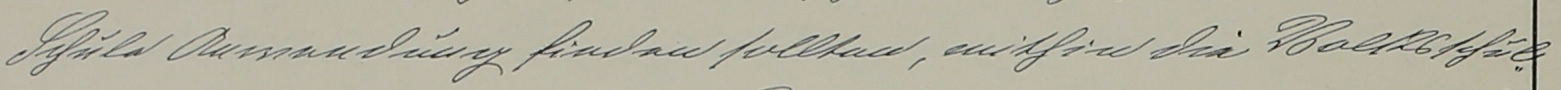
Schule Anwendung finden sollten, mithin die Volksschul-
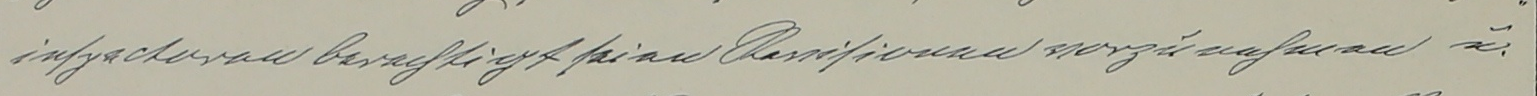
inspectoren berechtigt seien Revisionen vorzunehmen u.
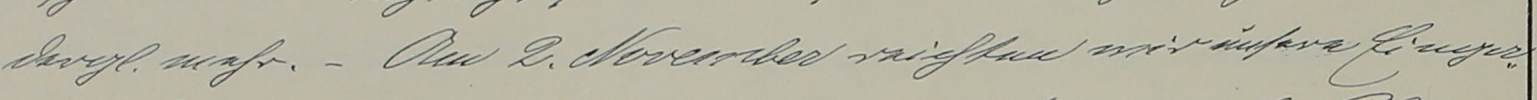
dergl. mehr. – Am 2. November reichten wir unsere Einga-
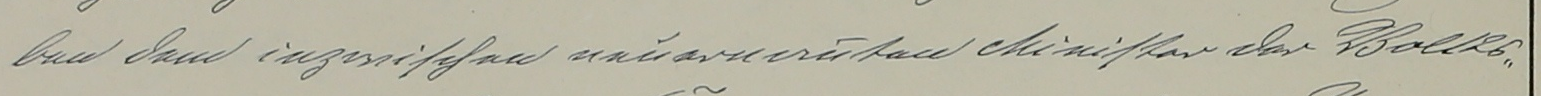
ben dem inzwischen neuernannten Minister der Volks-
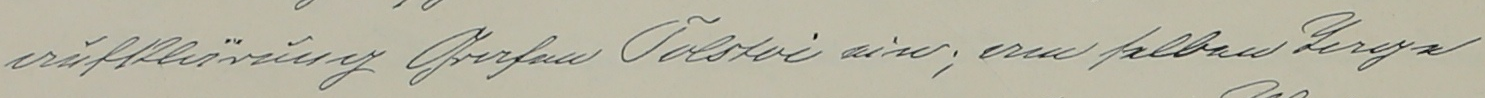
aufklärung Grafen Tolstoi ein; am selben Tage
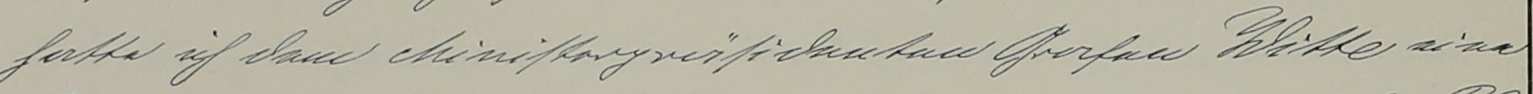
hatte ich dem Ministerpräsidenten Grafen Witte eine
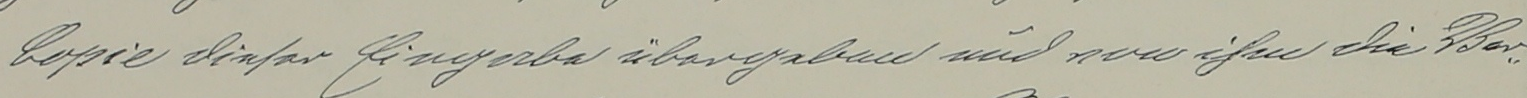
Copie dieser Eingabe übergeben und von ihm die Ver-
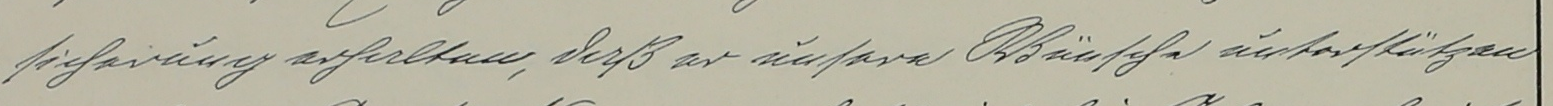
sicherung erhalten, daß er unsere Wünsche unterstützen
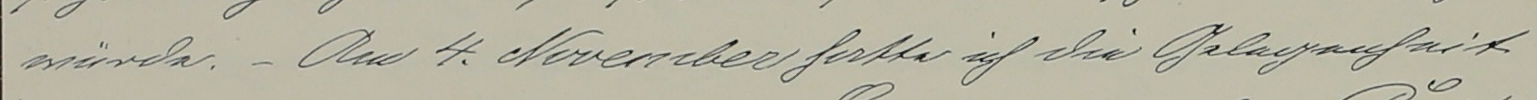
würde. – Am 4. November hatte ich die Gelegenheit
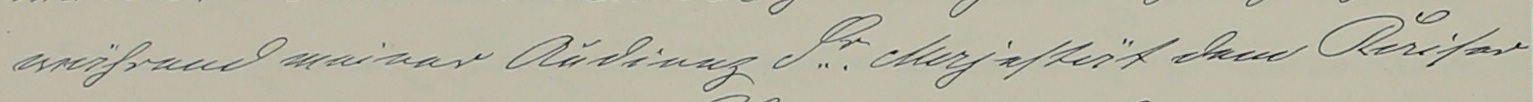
während meiner Audienz Sr. Majestät dem Kaiser
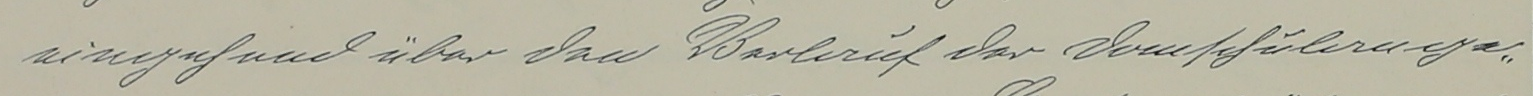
eingehend über den Verlauf der Domschulange-
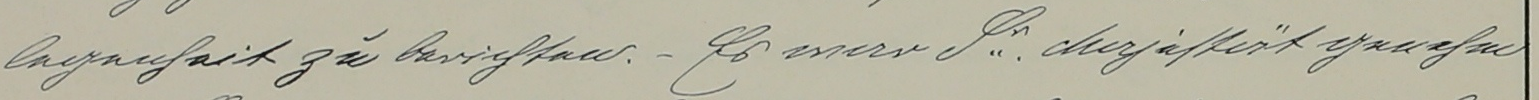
legenheit zu berichten. – Es war Sr. Majestät genehm
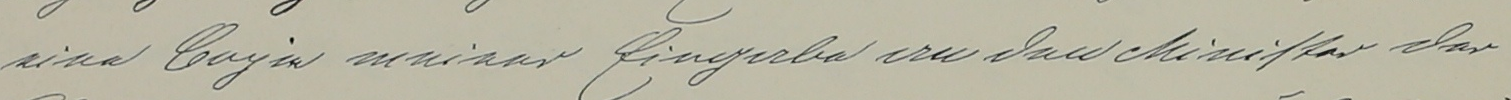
eine Copie meiner Eingabe an den Minister der
